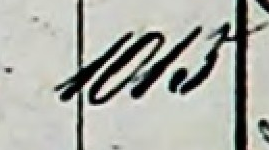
1015
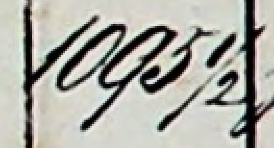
1095 ½
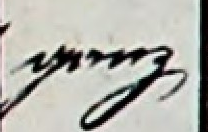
ganz
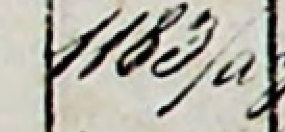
1183/a
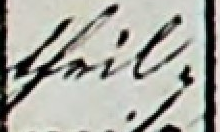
theil„
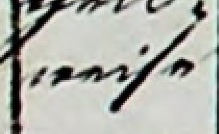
weise
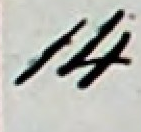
44
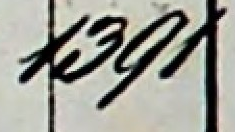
1391
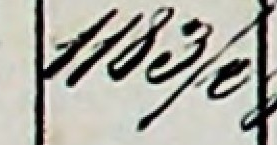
1183/c
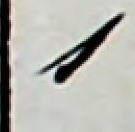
1
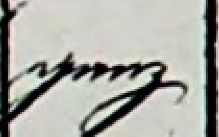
ganz
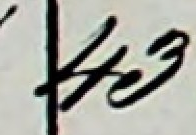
43
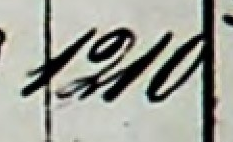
1210
